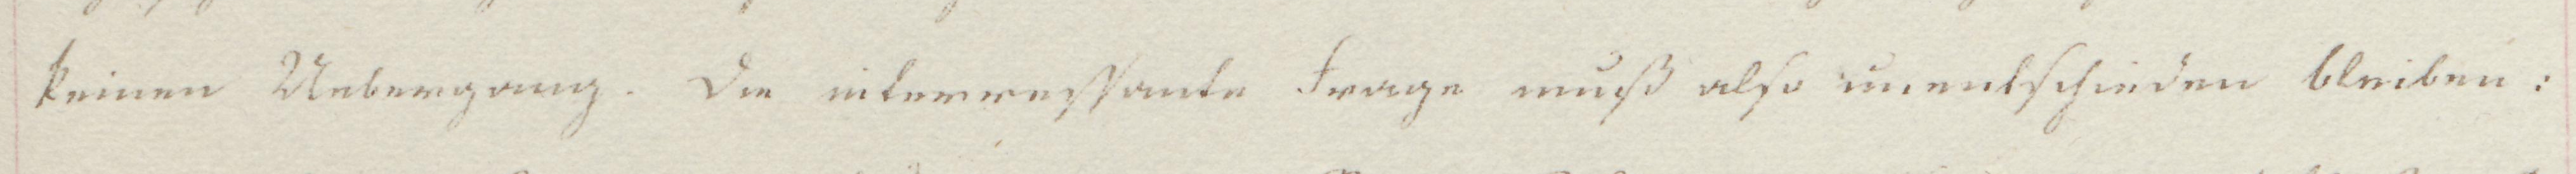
keinen Uebergang. Die interressante Frage muß also unentschieden bleiben:
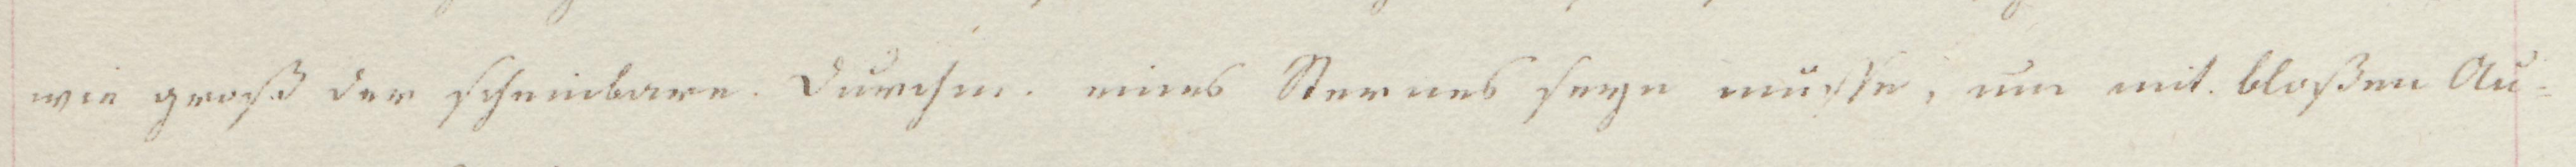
wie groß der scheinbare Durchm. eines Sternes seyn müsse, um mit bloßen Au-
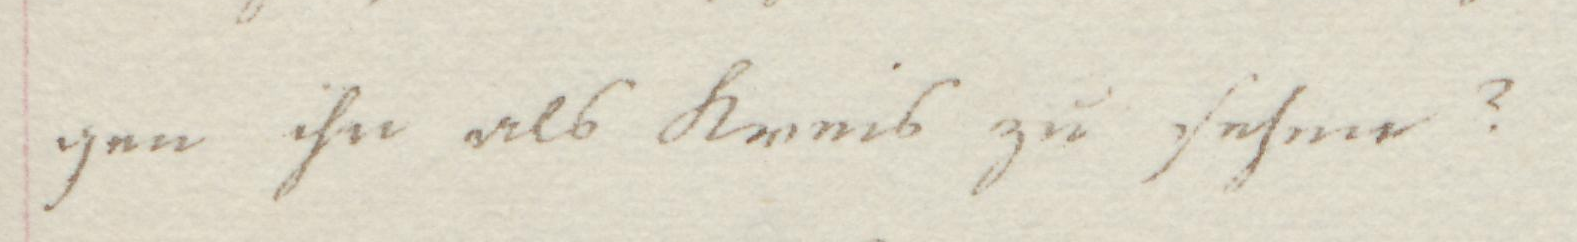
gen ihn als Kreis zu sehen?
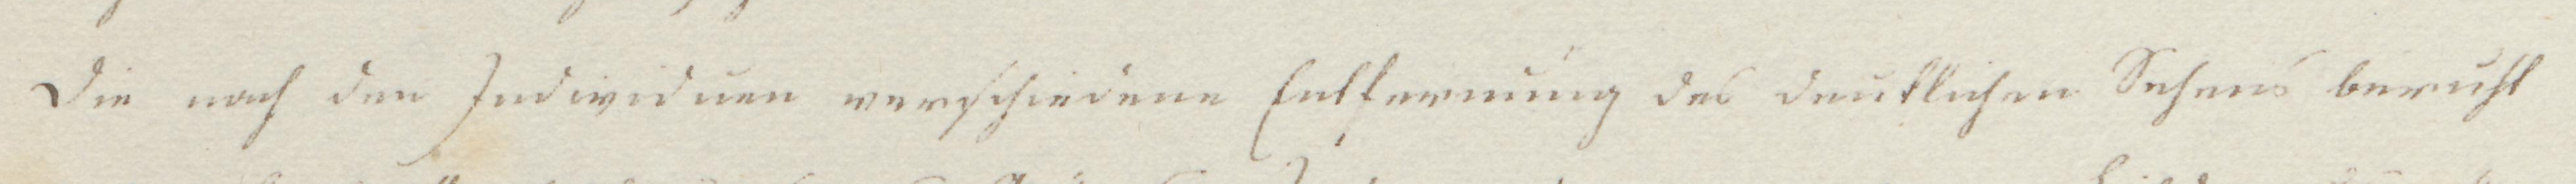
Die nach den Individuen verschiedene Entfernung des deutlichen Sehens beruht
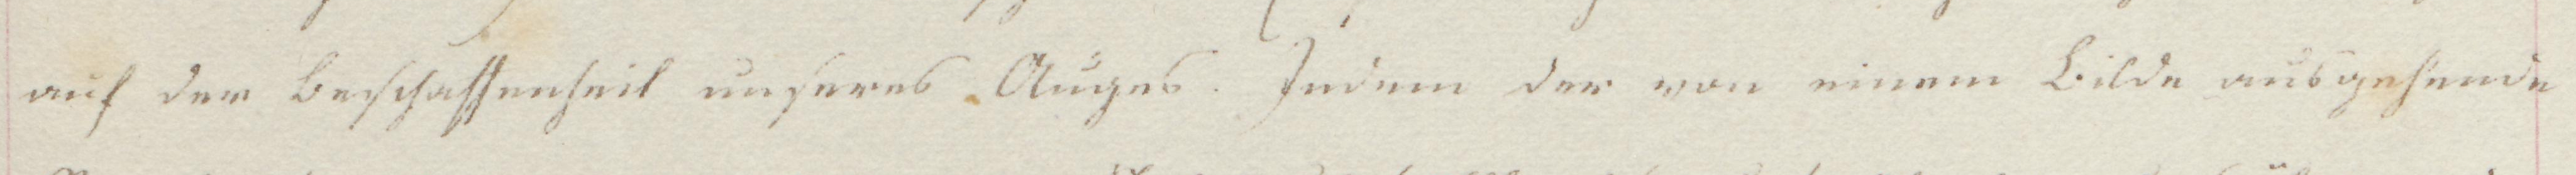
auf der Beschaffenheit unseres Auges. Indem der von einem Bilde ausgehende
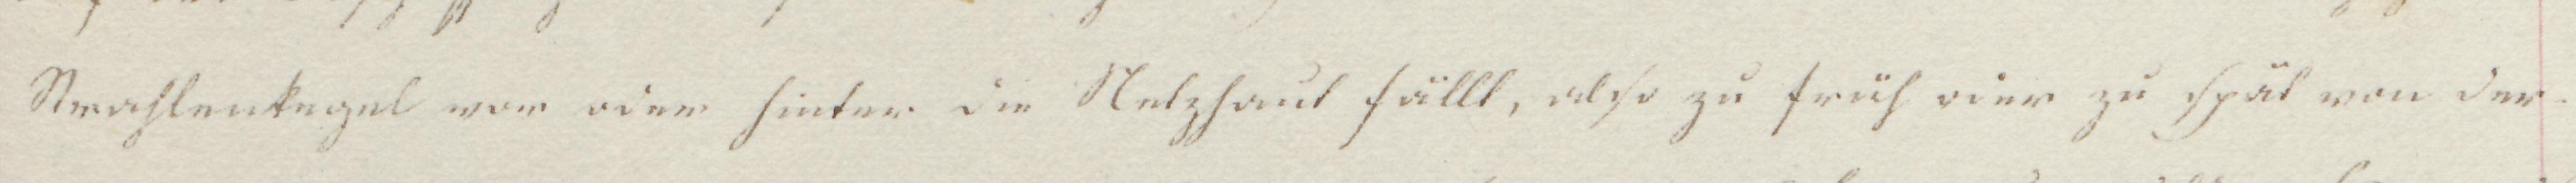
Strahlenkegel vor oder hinter die Netzhaut fällt, also zu früh oder zu spät von der-
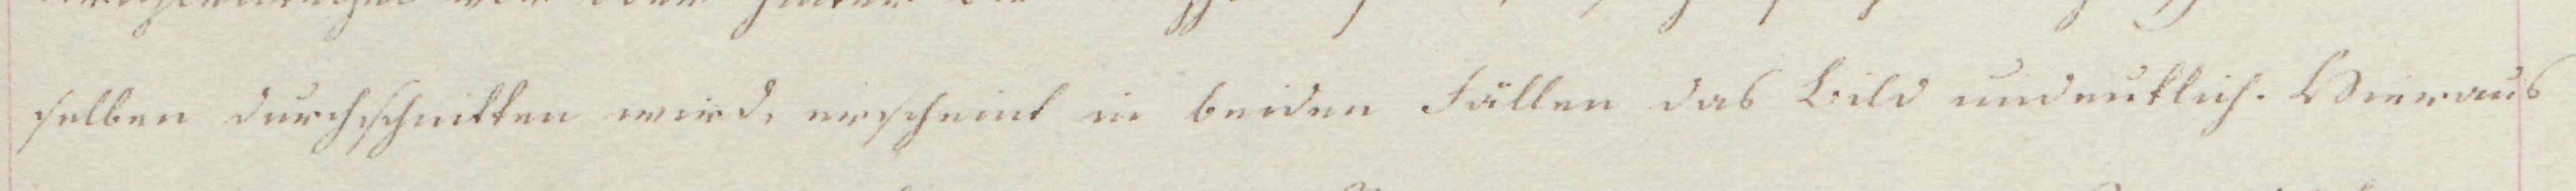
selben durchschnitten wird, erscheint in beiden Fällen das Bild undeutlich. Hieraus
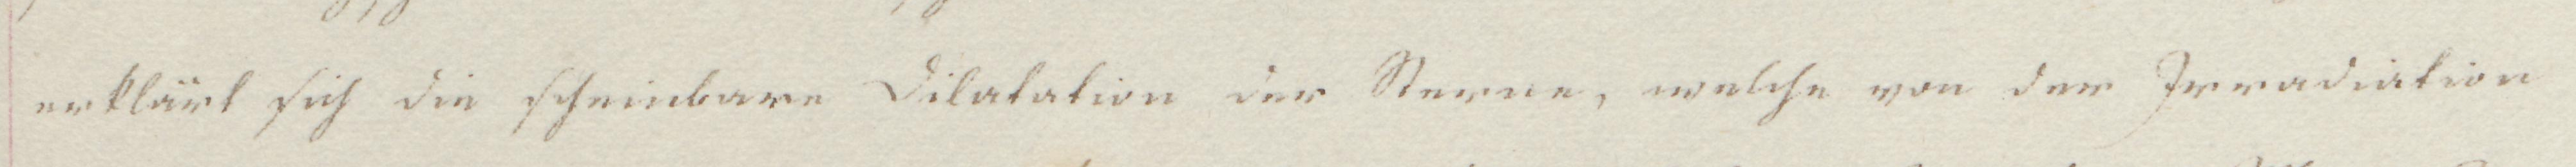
erklärt sich die scheinbare Dilatation der Sterne, welche von der Irradiation
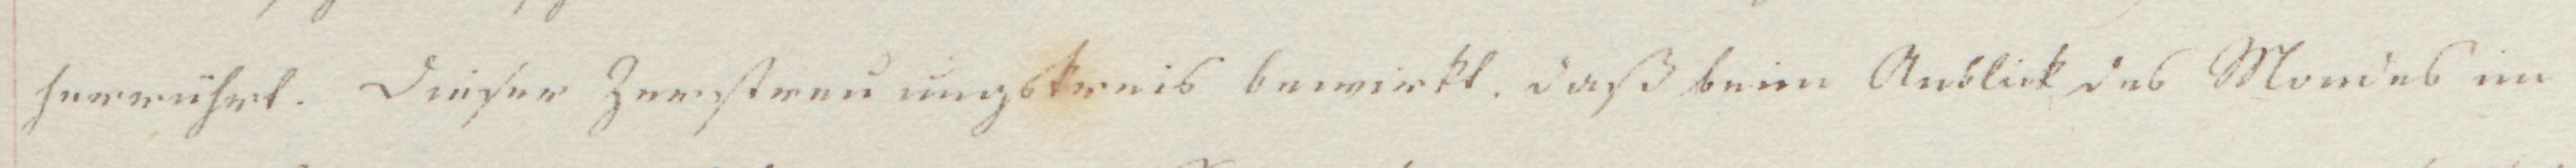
herrührt. Dieser Zerstreuungskreis bewirkt, daß beim Anblick des Mondes im
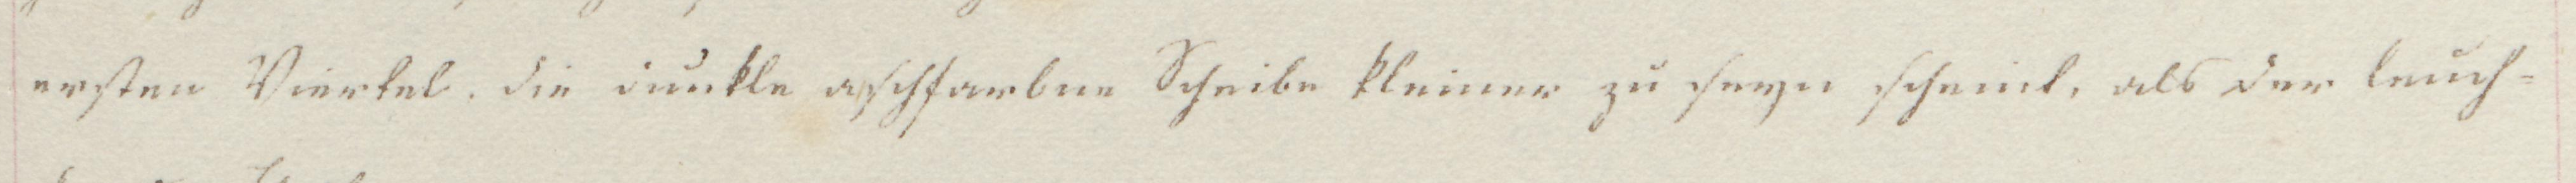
ersten Viertel, die dunkle aschfarbne Scheibe kleiner zu seyn scheint, als der leuch-
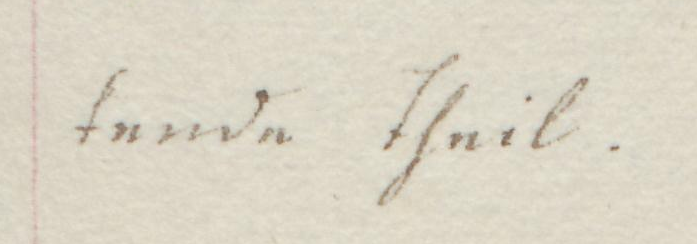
tende Theil.
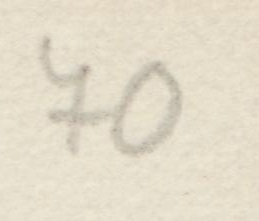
d. h.
